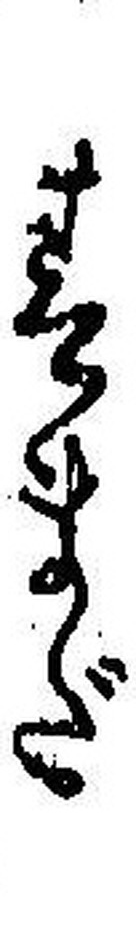春まだ
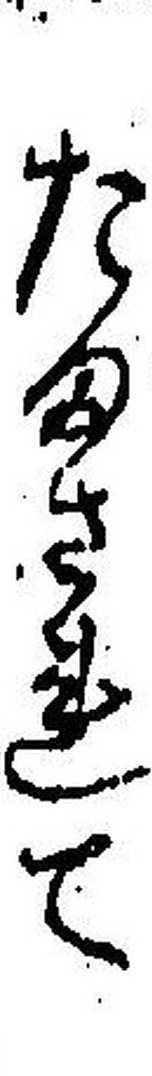たまされて
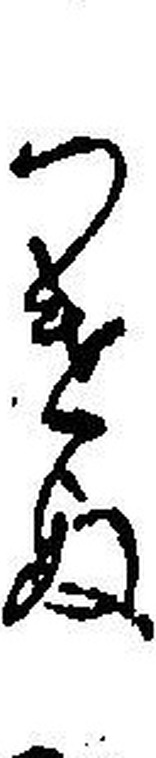つきぬ
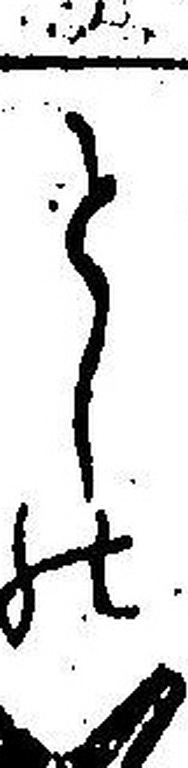としの
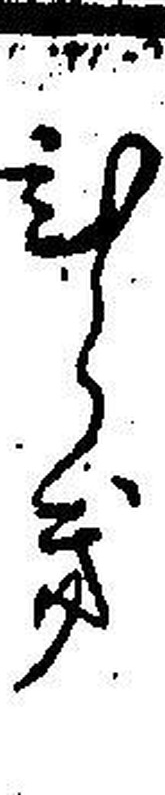ひらき
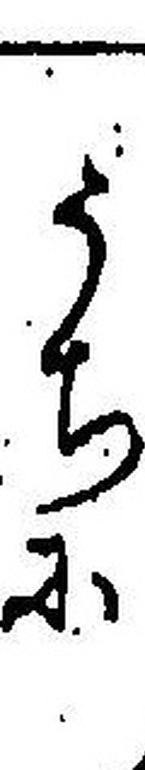うちに
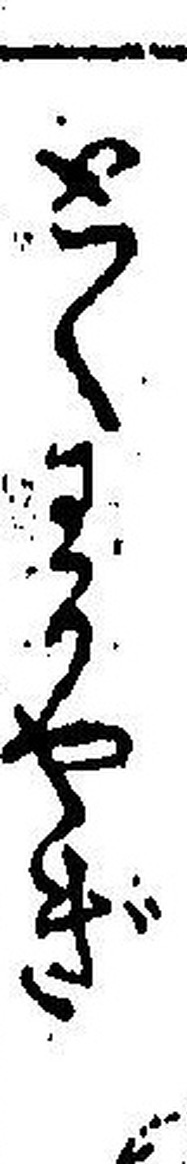とくわかやぎし
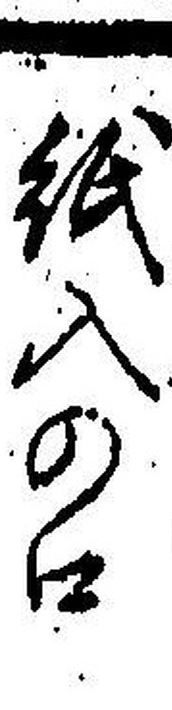紙入の口
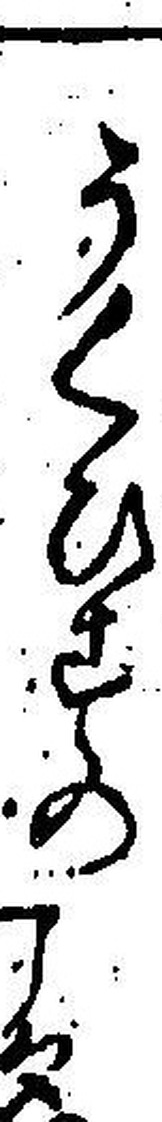うくひすのこゑ
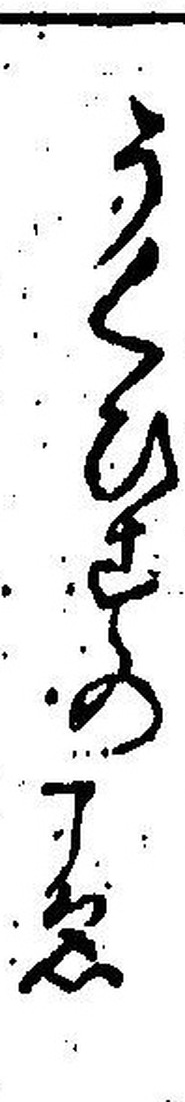うくひすのこゑ

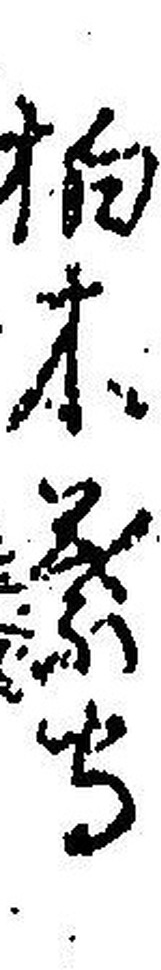柏木葉守
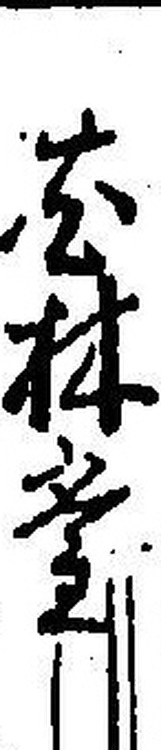花林堂
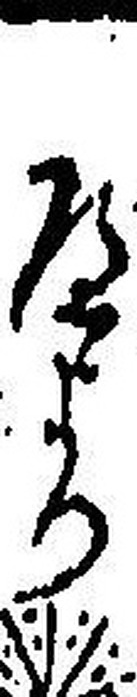べより
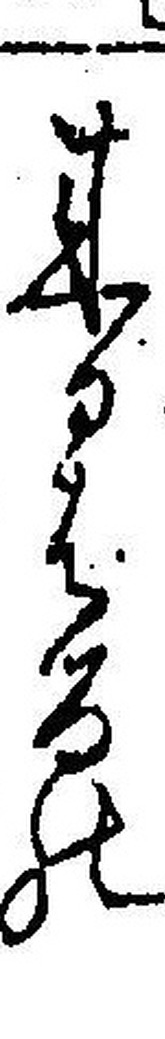来るはるの
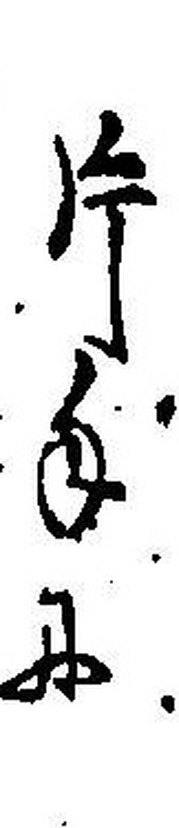片手に
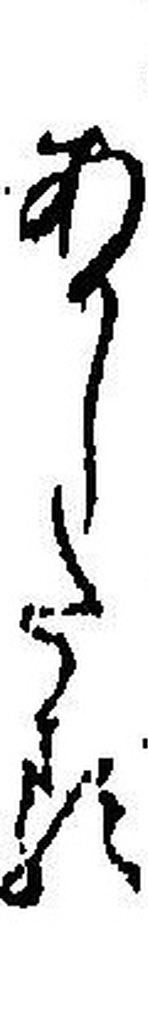あかしたる
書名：どうれ百人一首 / 鹿都部真顔(狂歌堂)編
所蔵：東京大学総合図書館 General Library in the University of Tokyo, JAPAN
